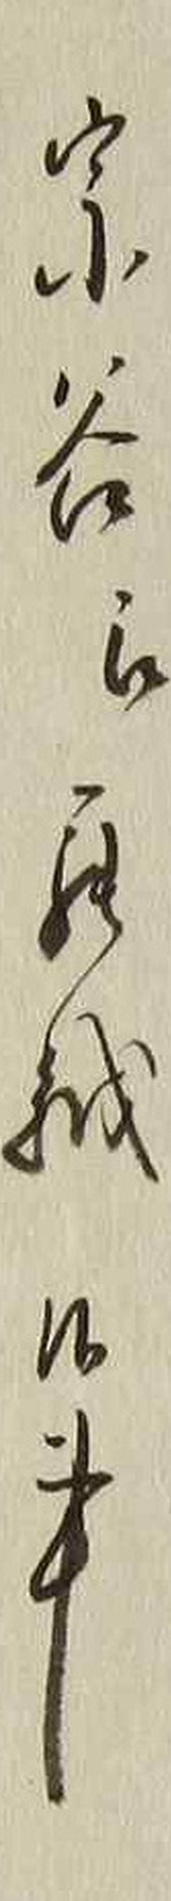宗谷江罷越候事
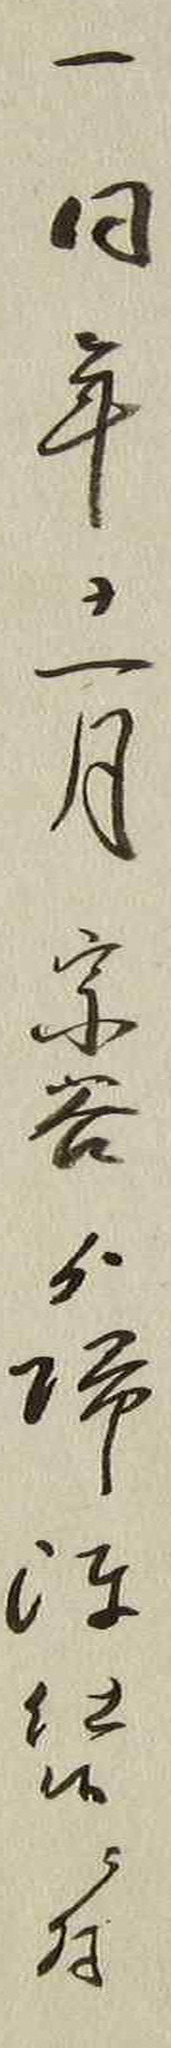一同年十一月宗谷ゟ帰陣仕候ニ付
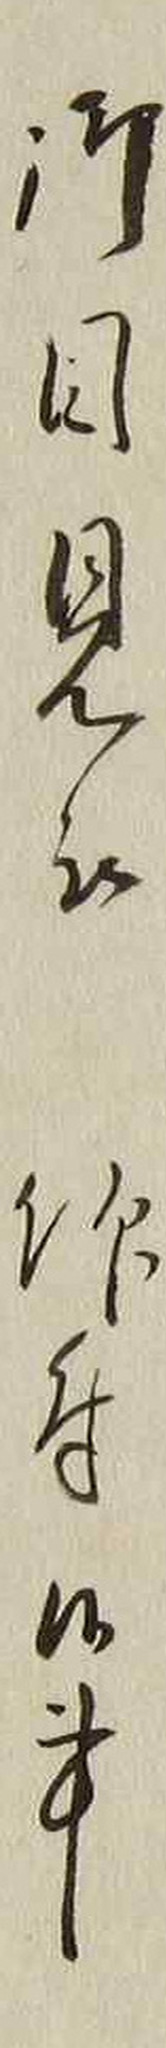御目見被仰付候事
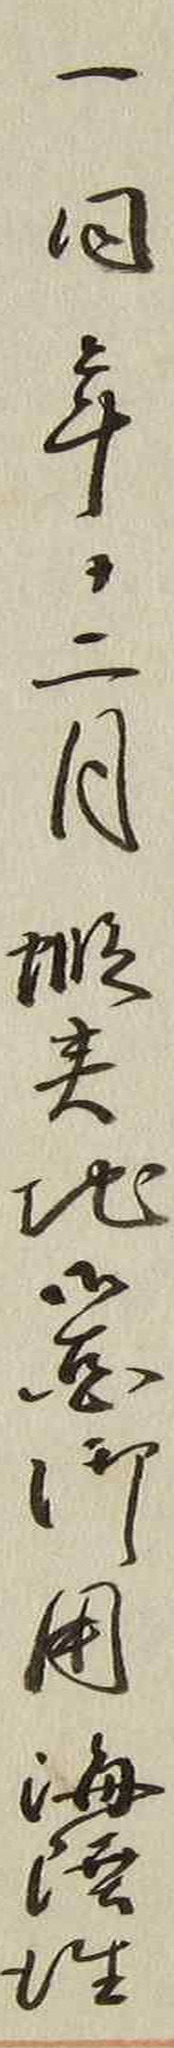一同年十二月蝦夷地御固御用海陸往
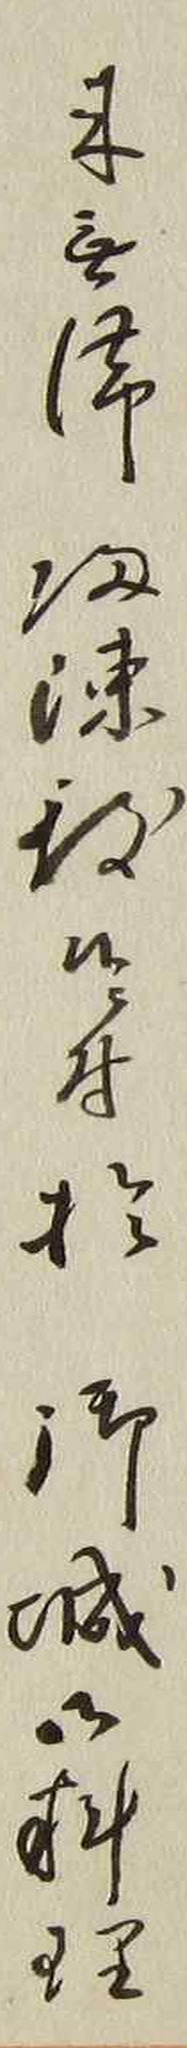来無滞帰陣致候ニ付於御城御科理
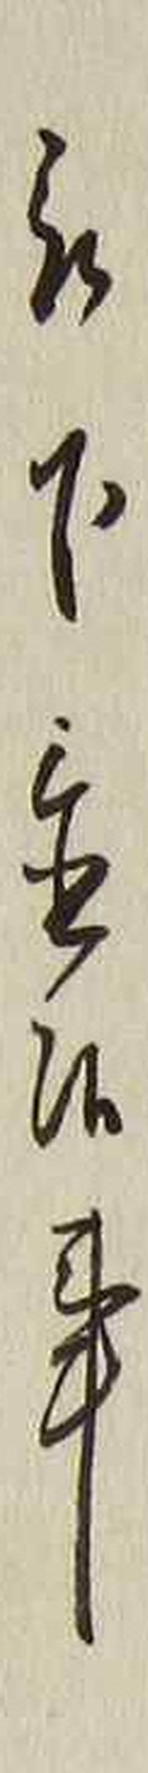被下置候事
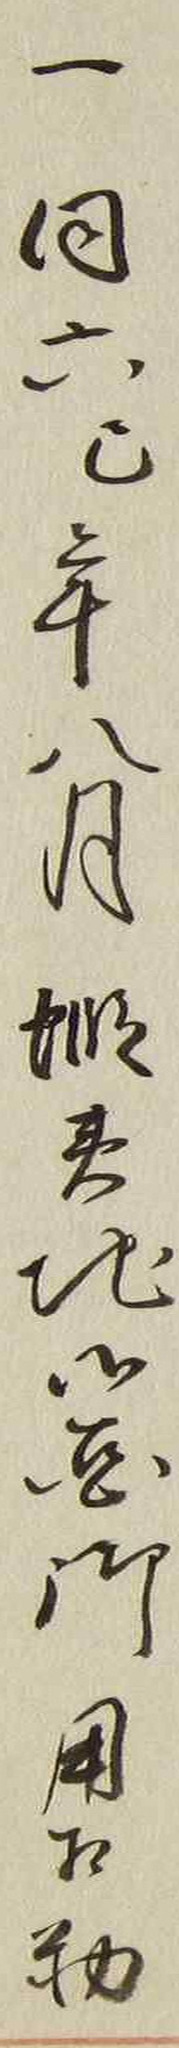一同六巳年八月蝦夷地御固御用相勤
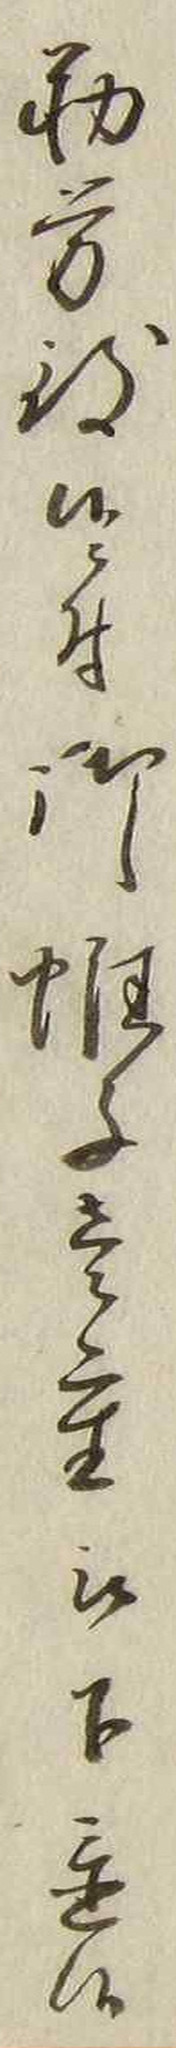勤労致候ニ付御帷子壱重被下置候

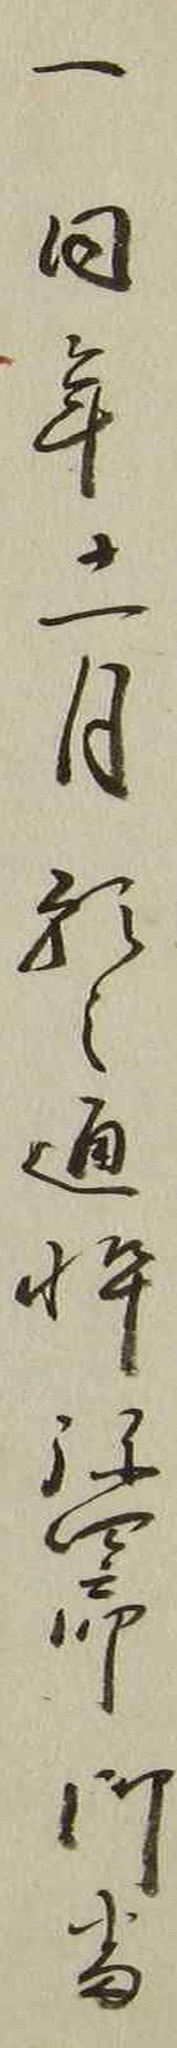一同年十一月願之通忰弥四郎御番
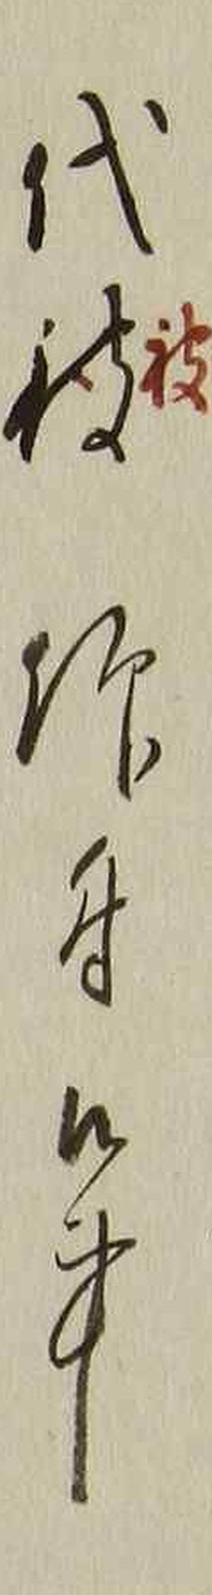被仰付候事
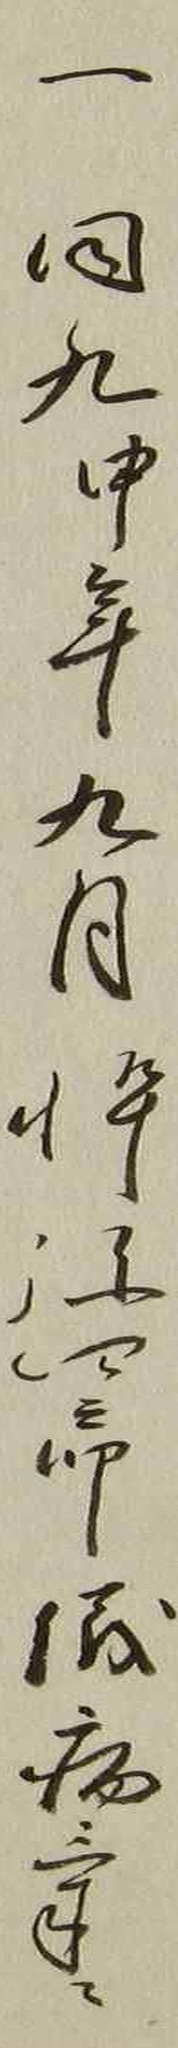一同九申年九月忰弥四師兵儀病気ニ
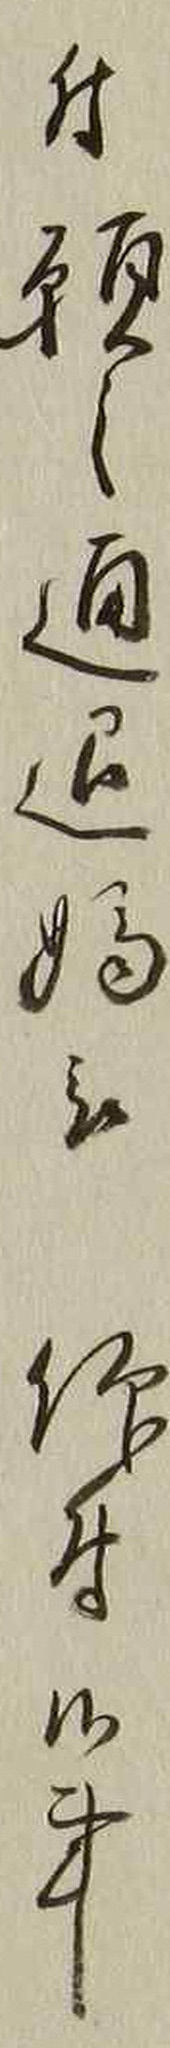付願之通退嫡被仰付候事
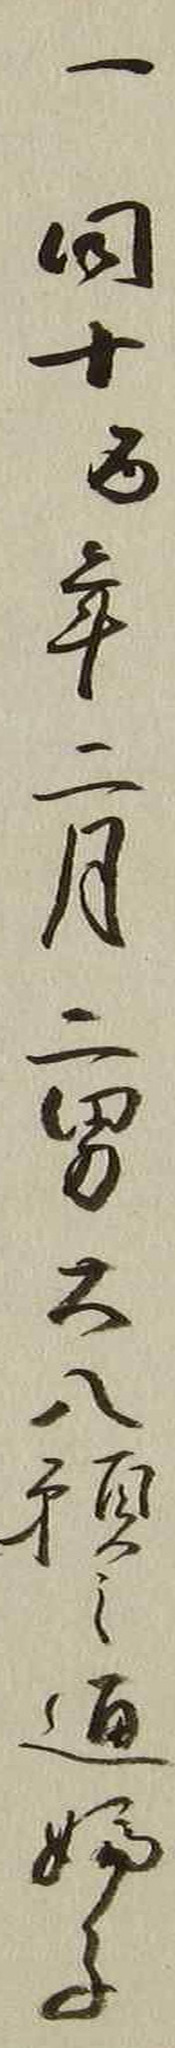一同十酉年二月二男大八願之通嫡子
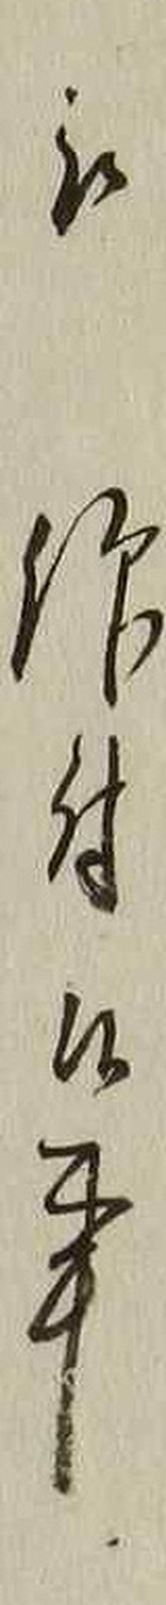被仰付候事
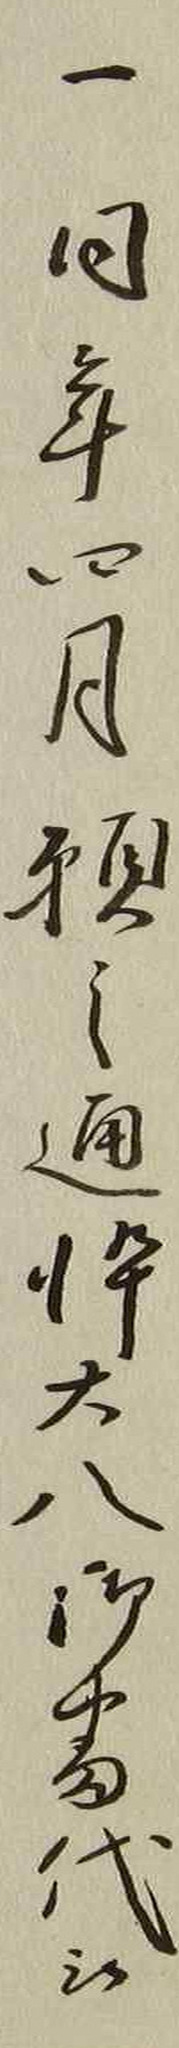一同年四月願之通忰大八御番代被
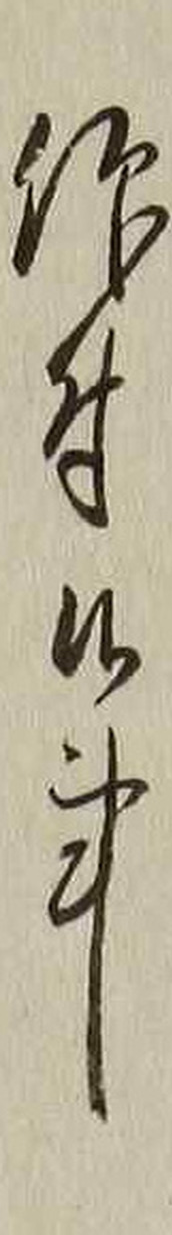仰付候事
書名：諸士系譜　巻之122　よ之部5
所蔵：会津若松市立会津図書館
